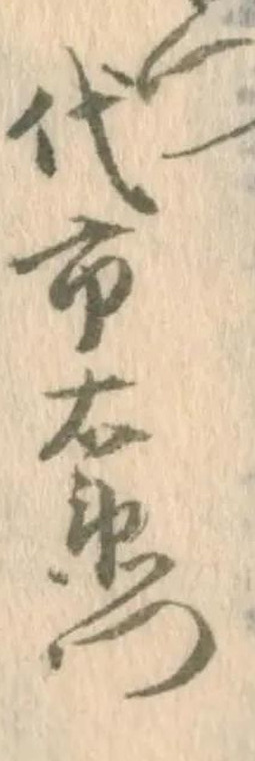代市右衛門
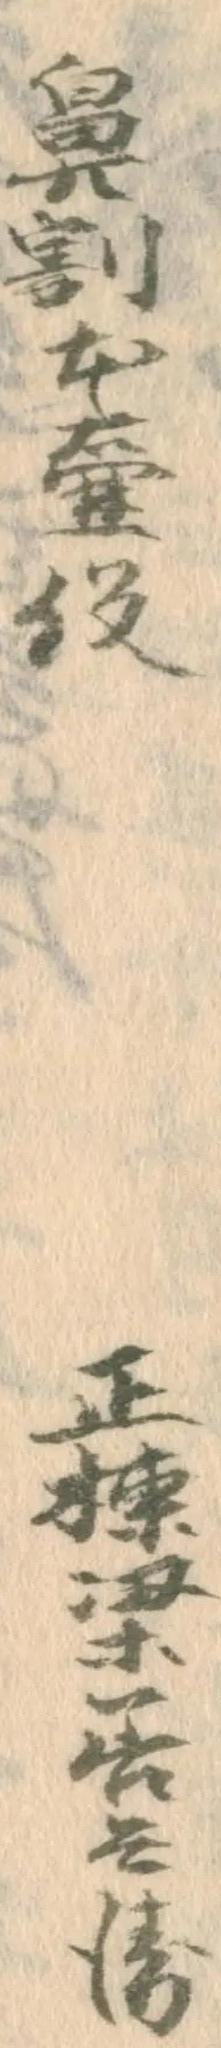鼻割本壷役正棟梁善兵衛
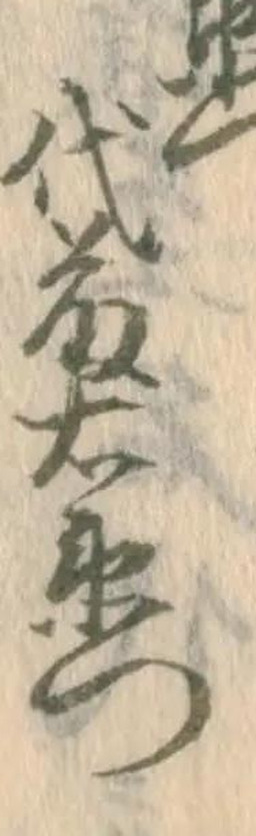代藤右衛門
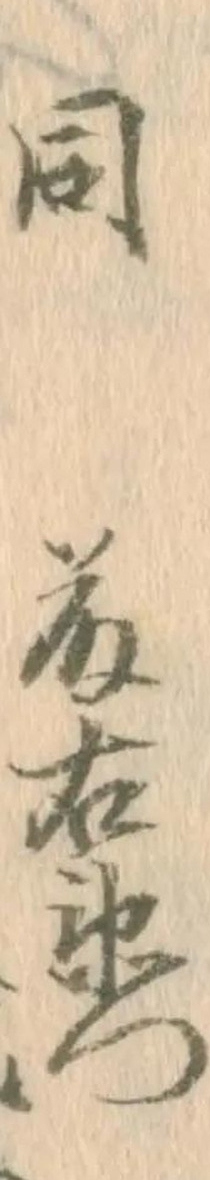代藤右衛門
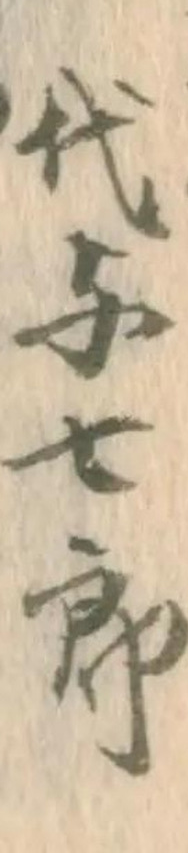代与七郎
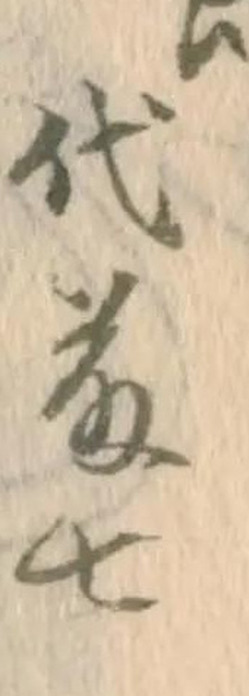代藤七
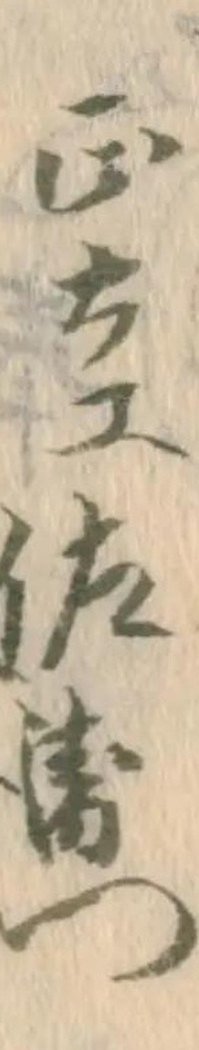正大工左衛門
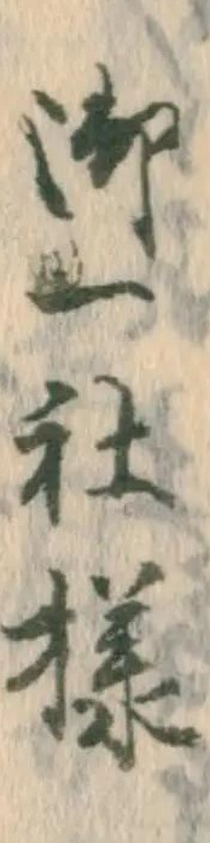御一社様
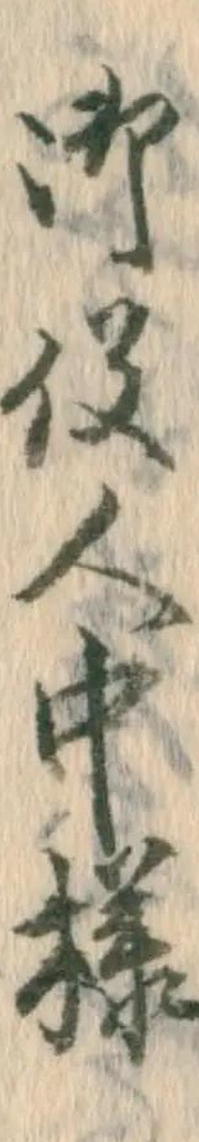御役人中様
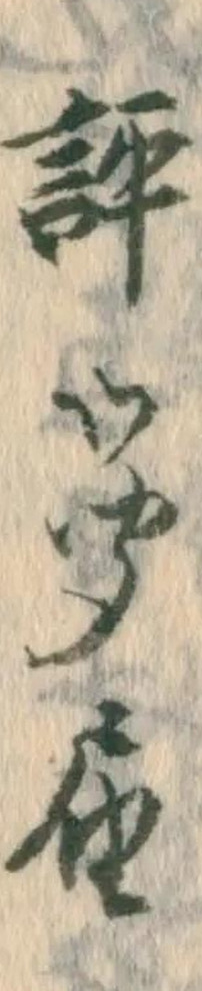評御聞届
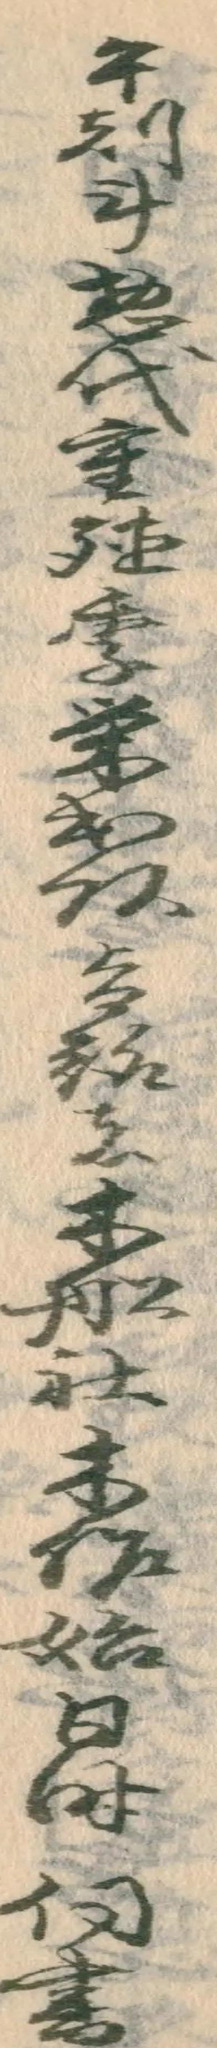一午刻計惣代重殖季栄出頭旨趣は木船社木作始日時伺書
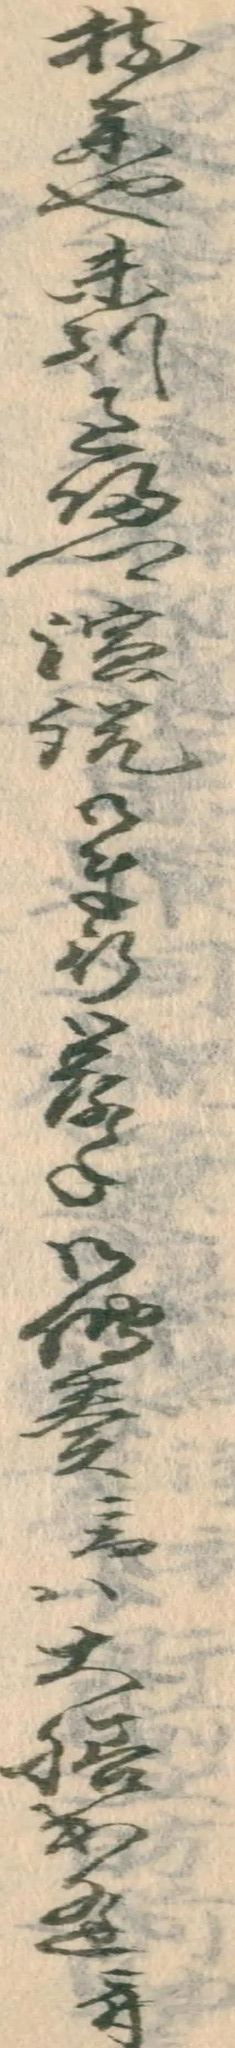持参也未刻過帰郷演説御奉行御落手御伝奏に而ハ大膳出逢ニ付
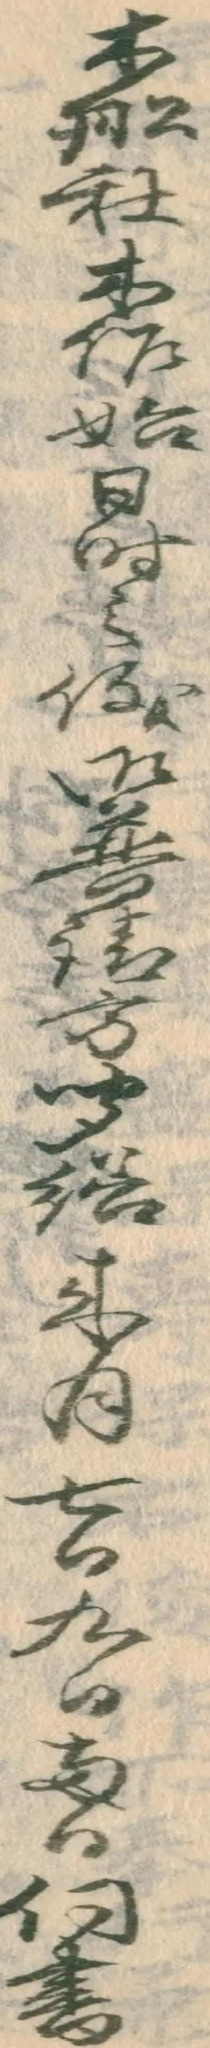木船社木作始日時之儀御普請方聞繕来月七日九日両日伺書
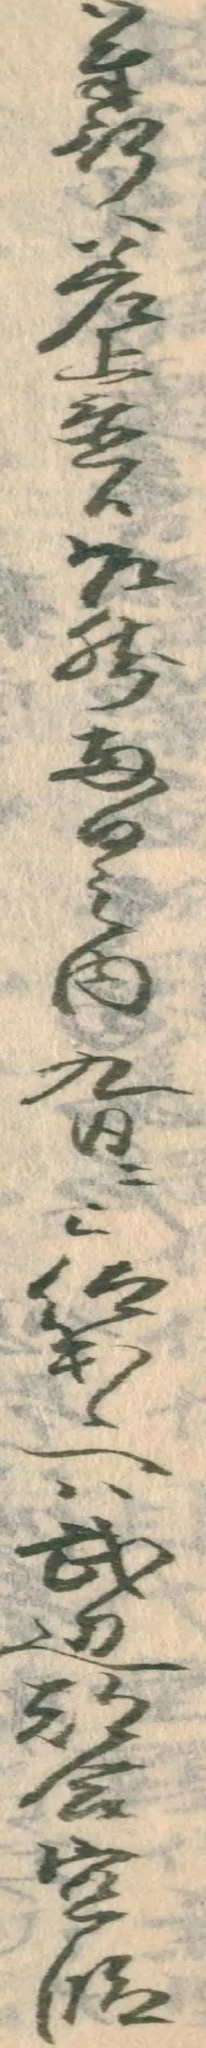御奉行へ差上置候乍然両日之内九日ニ被仰出候ヘハ武辺都合宜段
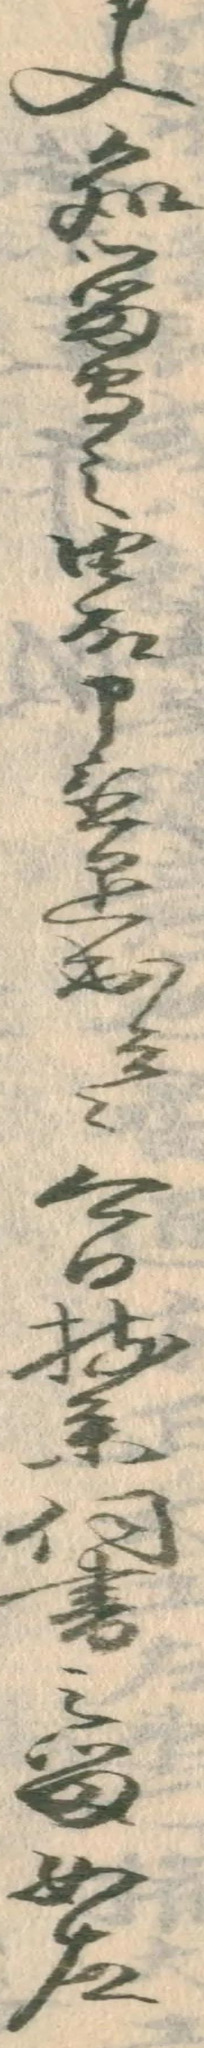申入候処御留守之由故申置退出云々今日持参伺書之留如左
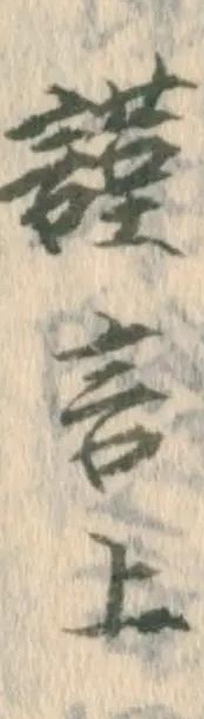謹言上
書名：賀茂社記録. 第17冊
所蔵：国立国会図書館 National Diet Library, JAPAN
